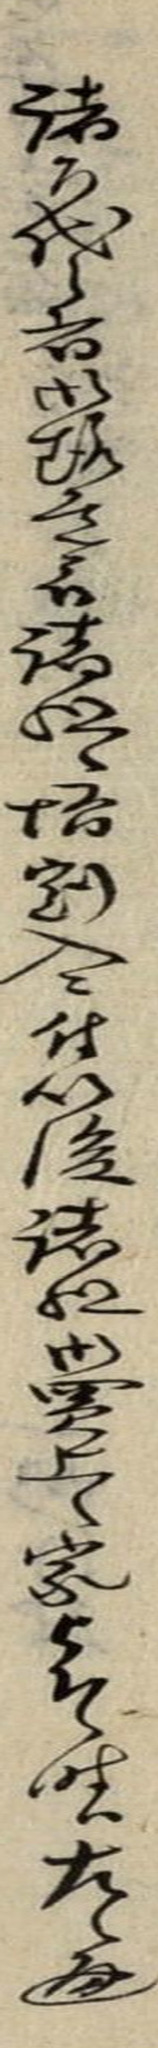諸下代之者御趣意に付諸組へ増割入に付以後諸組御買上候家被下候時は左之通
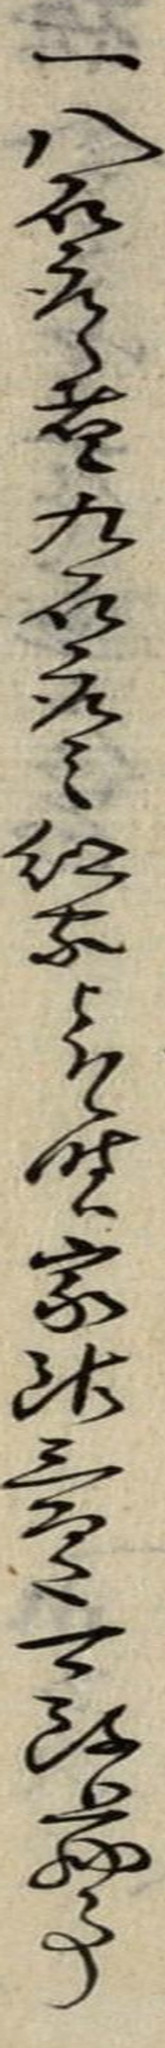一八石取之者も九石取之組家被下候時は家銀三百匁可致上納事
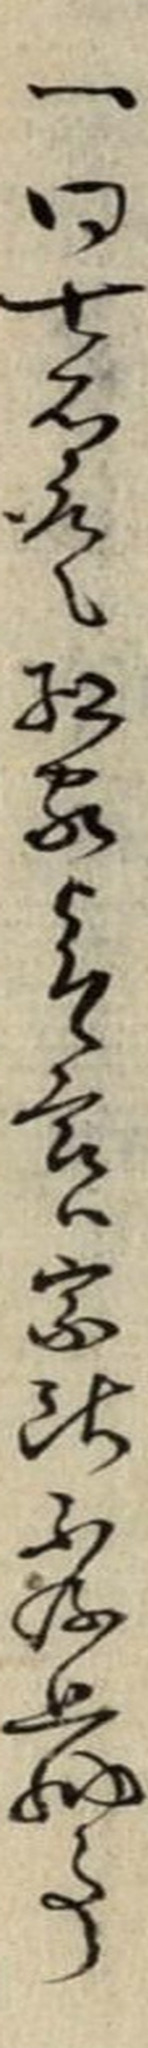一同七石取之組家被下候節は家銀不及上納事
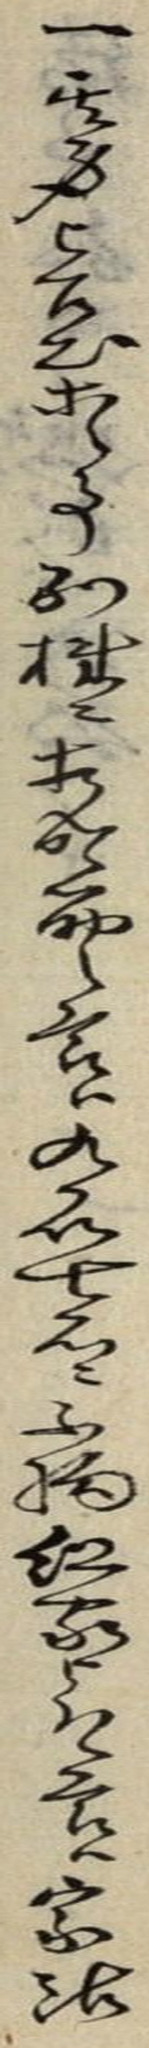一其身被召出等之事別株に相成候筋之節は九石七石に不拘組家被下候節は家銀
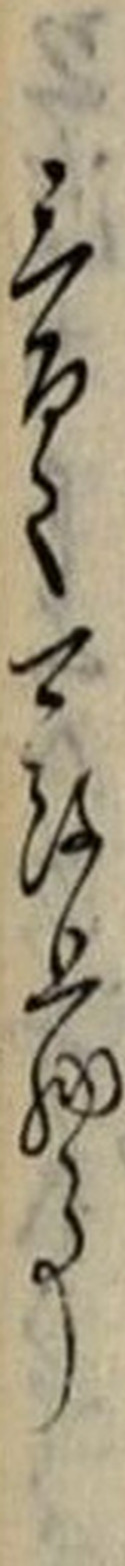三百匁可致上納事
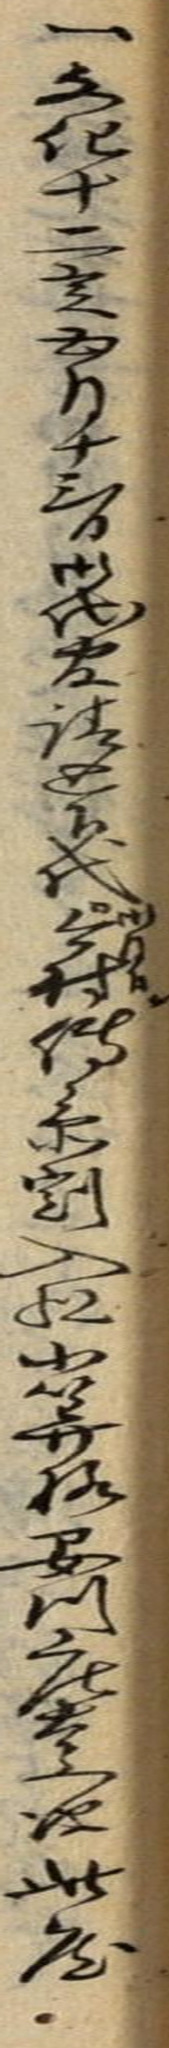一文化十二亥五月十三日御代官請込下代◦御目付今村伝兵衛割入組小算格安川庄太夫儀此度
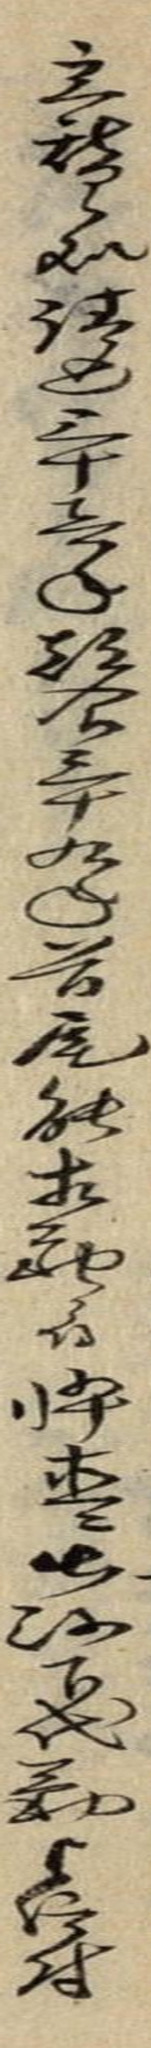立替候処請込三十壱年都合三十九年首尾能相勤候に付忰直に出役下代勤被仰付
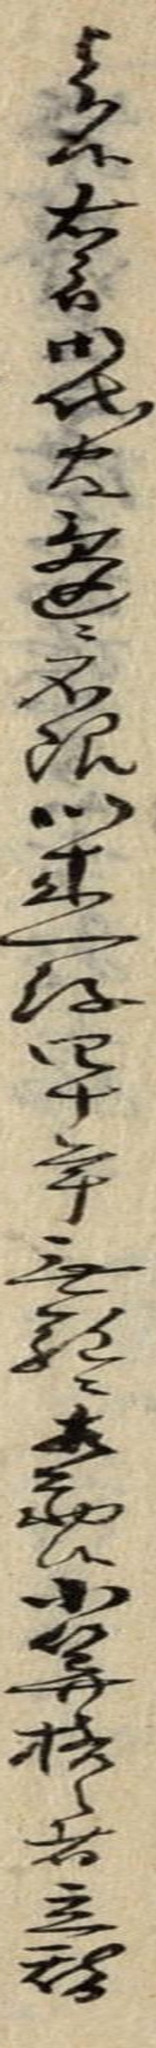被下候右に付御代官受込に不限以来一役四十年無難に相勤候小算格之者立替
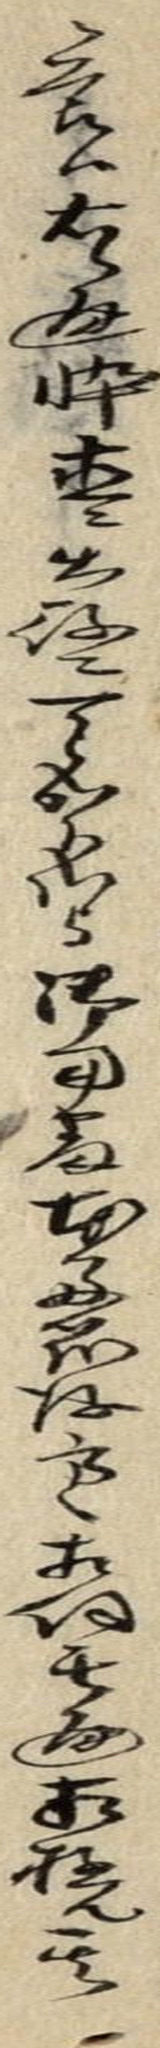候節は右之通忰直に出役に可被成下哉と御用番本多筑後方へ相伺其通相極ル其
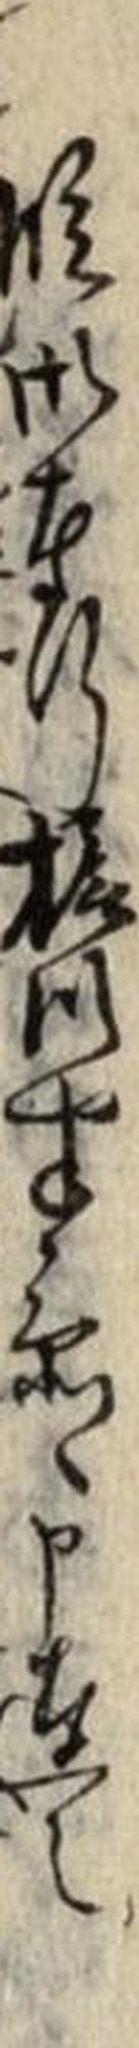段御奉行梶川半兵衛へ申達之
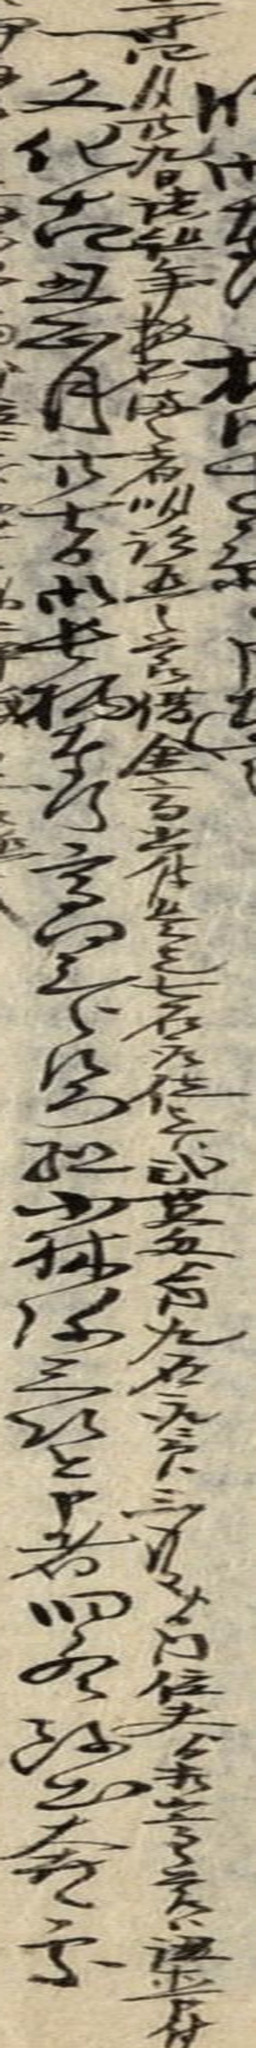一文化十四丑正月廿七日御長柄奉行高田三郎左衛門組小林弥三郎と申者旧冬致出奔候処
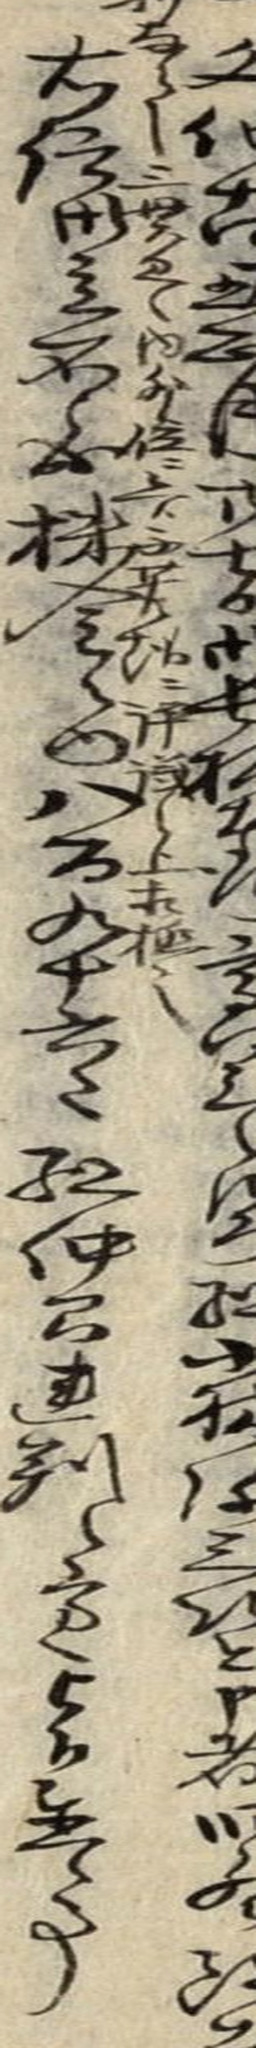右跡御立不被成株金之内八百九十六匁組仲間連判候方へ被下置候事
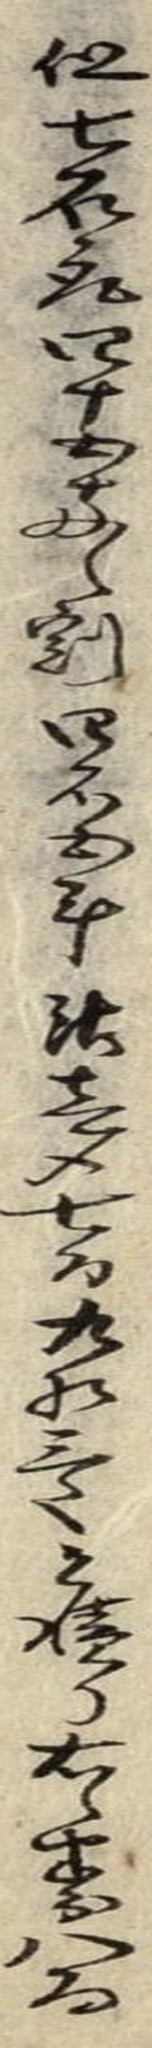但七石取四十五両之割四石五斗銀壱貫七百九拾三匁と積り右之半分八百
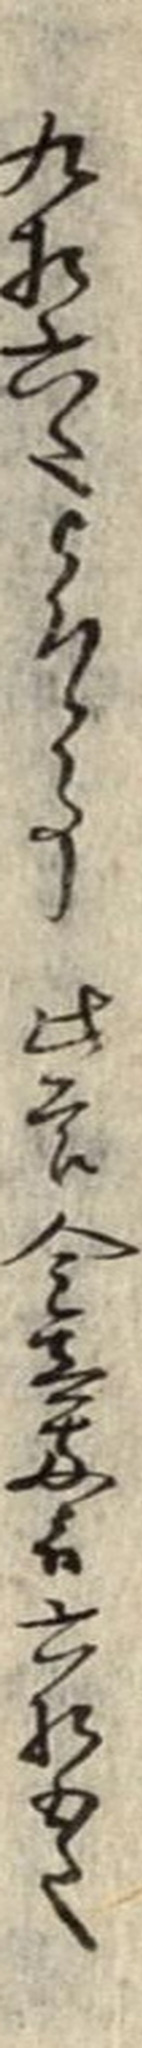九拾六匁被下候事此節金壱両に付六拾五匁
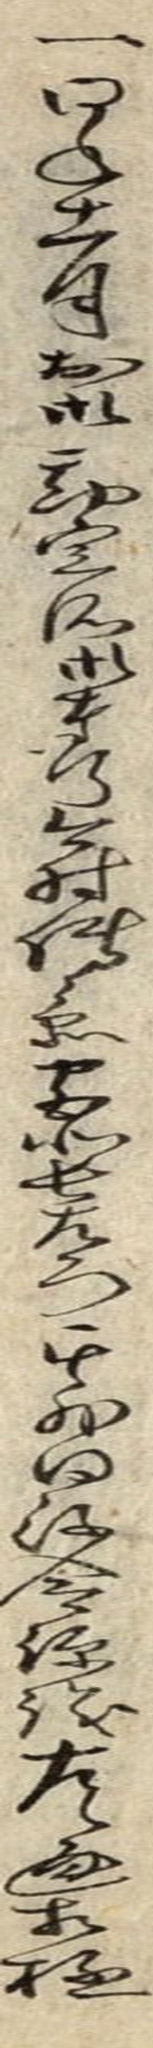一同年十一月於御勘定所御奉行今村伝兵衛宮北長左衛門其外同役令評議左之通相極
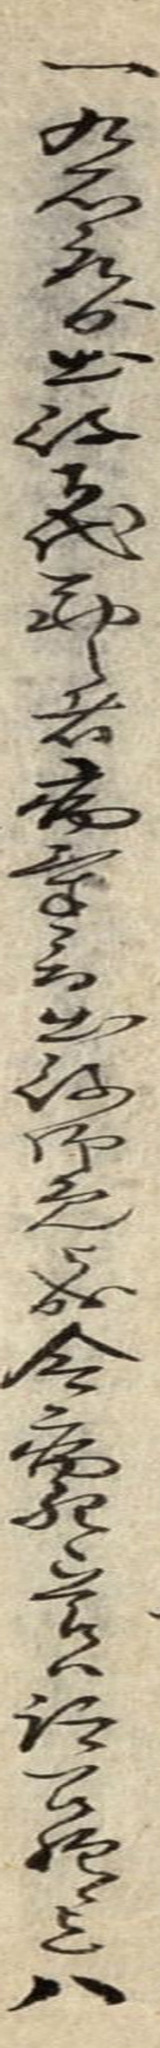一九石取ゟ出役下代勤候者病気に而出役御免被成令病死候節は跡召抱候迄八
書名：御用并被仰出之部
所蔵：福井県文書館 Fukui Prefectural Archives
